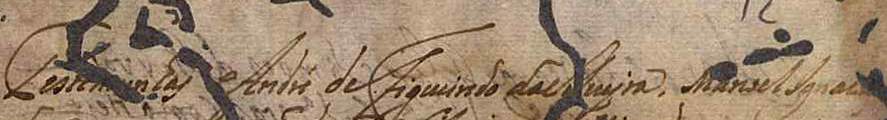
Testemunhas Andre de Figueiredo da S_luejra, Manoel Ignac
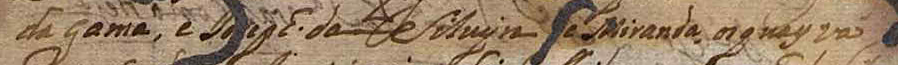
da gama, e Io_eph da Siluejra e Miranda, os quais vaõ
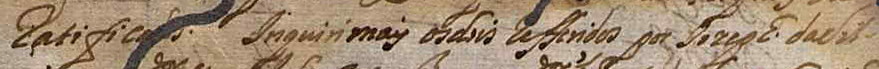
Ratificados. Inquiri mais os dois Refferidos por Iozeph da Sil
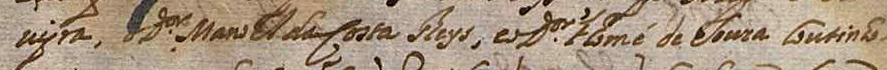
uejra, o D.or Manoel da Costa Reys, e o D.or Thomé de Souza Coutinho
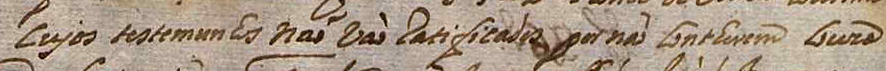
cujos testemunhos naõ vaõ Ratificados por naõ contherem couza
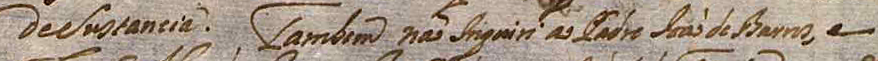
de Sustancia. Tambem naõ Inquiri ao Padre Ioaõ de Barros, e
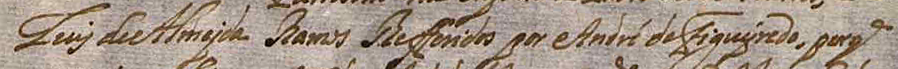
Luis de Almejda Ramos Refferidos por André de Figueiredo, porq̄
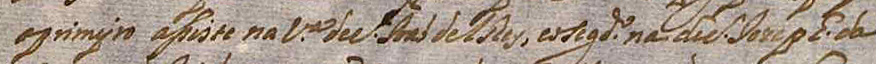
o primejro assiste na V.a de S. Ioaõ del Rey, e o segd.o na de S. Iozeph da
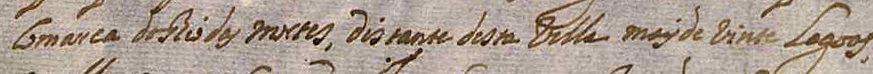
comarca do Rio das mortes, distante desta Villa mais de vinte Legoas,
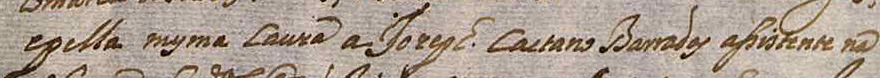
e pella mesma cauza a Jozeph. Caetano Barradas assistente na
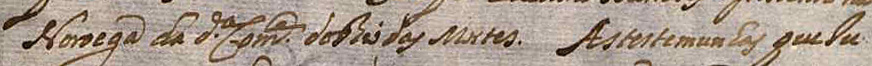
Noroega da d.a Com.a do Rio das Mortes. As testemunhas que Iu
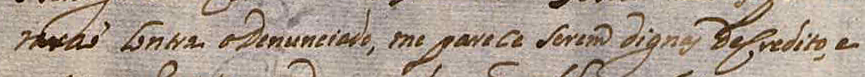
raraõ contra o Denunciado, me parece serem dignas de Credito, e
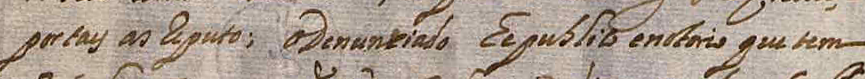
por taes as Reputo; o Denunciado he publico e notorio que tem
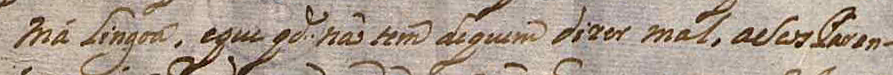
má Lingoa, e que qd.o naõ tem de quem dizer mal, a Seos Paren
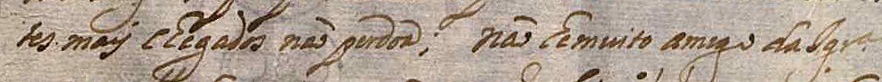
tes mais chegados naõ perdoa; não he muito amigo da Igr.a
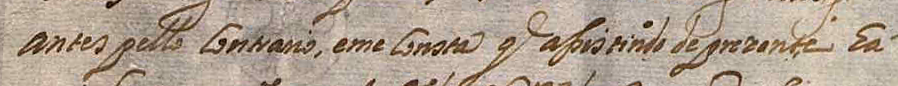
antes pello contrario, e me consta, q̄ assistindo de prezente há
